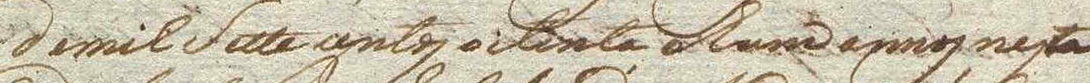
de mil Settecentos oitenta, e hum annos nesta
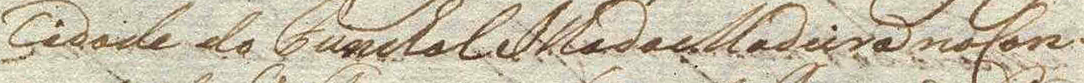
Cidade do Funchal Ilha da Madeira no Con
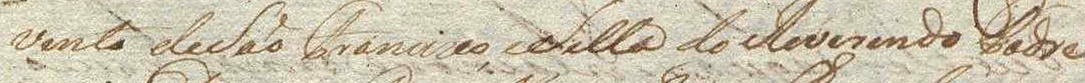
vento de Saõ Francisco, e Salla do Reverendo Padre
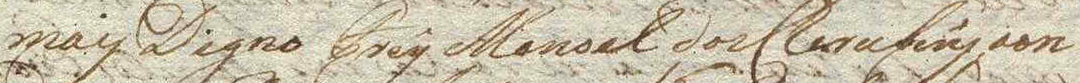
mais Digno Frey Manoel dos Cherubin̄s, aon
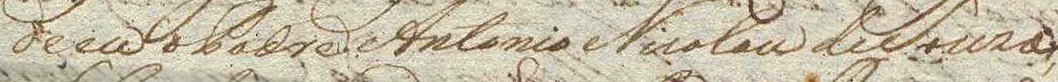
de eu o Padre Antonio Nicolau de Souza,
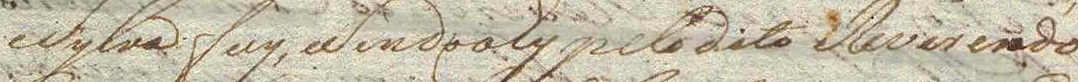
e Sylva fuy, e Sendo ahy pelo dito Reverendo
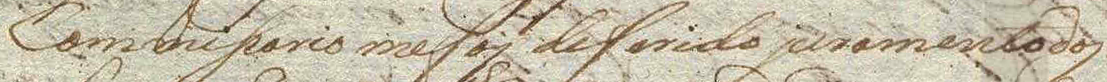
Commissario me foj deferido juramento dos
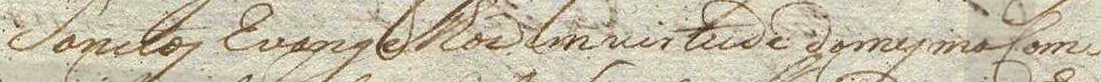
Sanctos Evangelhos em virtude da mesma Comi
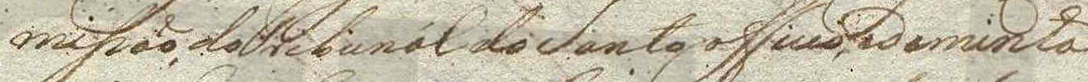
missaõ, do Tribunál do Santo officio, e da minha
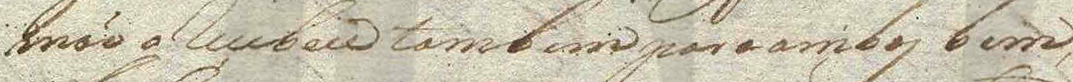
maõ o Reçebeu tambem para ambos bem,
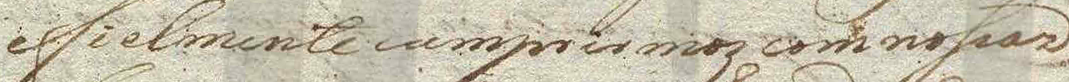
e fielmente cumprirmos com nossas
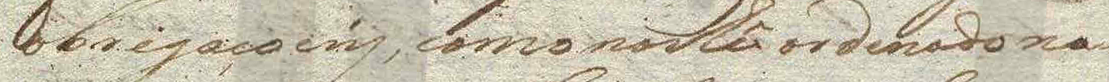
obrigaçoen̄s, como nos hê ordenado na
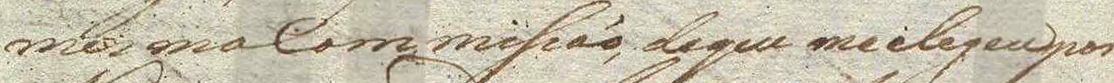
mesma Commissaõ, de que ilegeu por
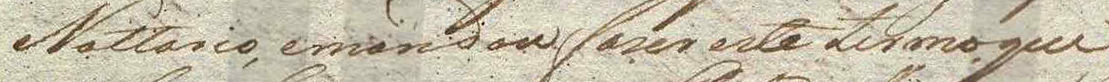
Nottario, e mandou fazer este termo, que
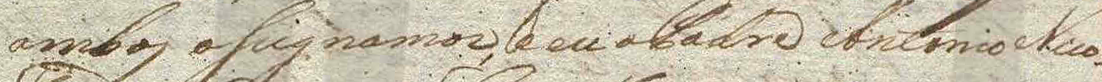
ambos assignamos, e eu o Padre Antonio Nico
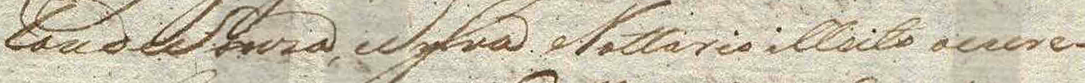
lau de Souza, e Sylva Nottario illeito o escre
